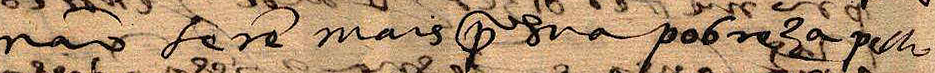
naõ serē mais p̄o sua pobreza pello
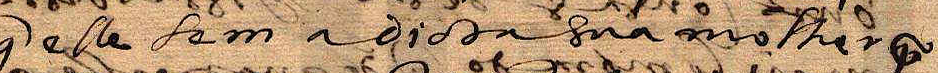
q̄ elle tem a dicta sua molher p̄o
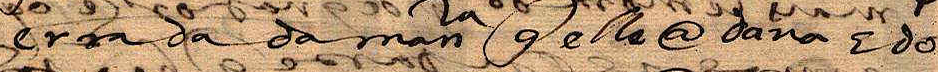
errada da manra q̄ elle ādaua E do
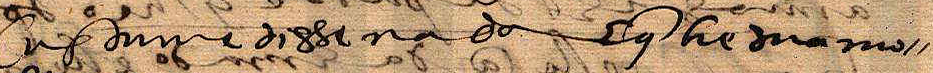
Custume disse nada E q̄ he sua mo
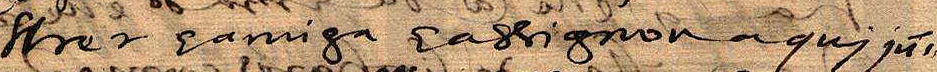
lher E amiga E assignou aquj jū
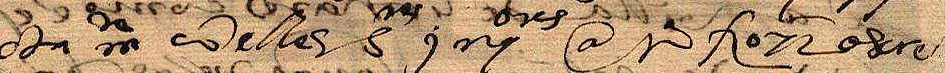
ctamte cō elles sres jnqores āto Royz̄ o scre
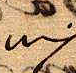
uy
